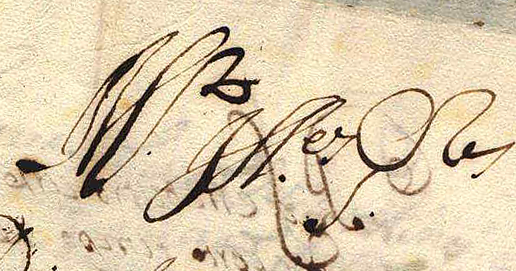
M.to Jll.es s.Res
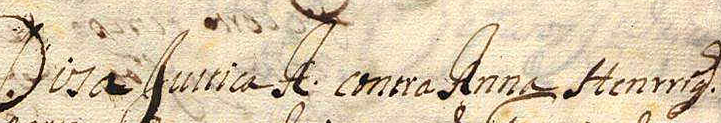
Dis a Justiça A. contra Anna Henrriq.s
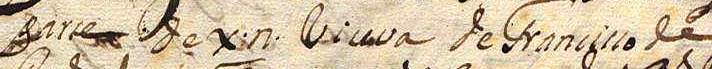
parte de x. n. Viuva de Francisco de
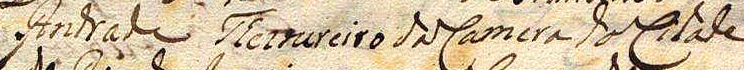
Andrade Thezoureiro da Camera da Cidade
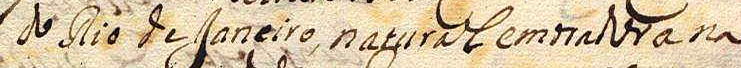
do Rio de Janeiro, natural e moradora na
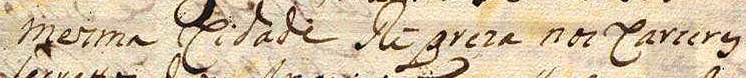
mesma Cidade Ré preza nos Carceres
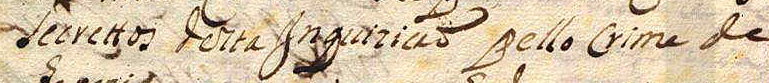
secrettos desta Jnquiziçaõ pello Crime de
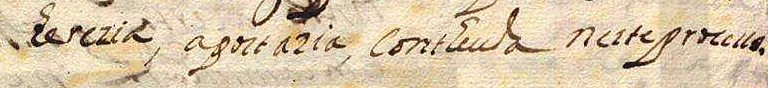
herezia, apostazia, contheuda neste processo.
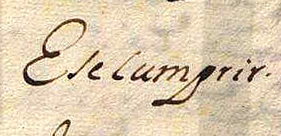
E se cumprir.
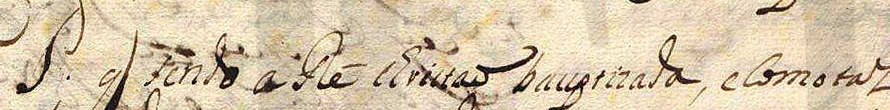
P. q̄ sendo a Re christaõ bauptizada, e Como tal
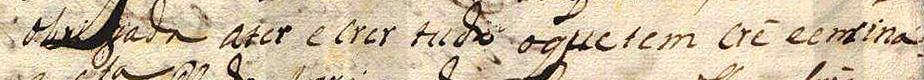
obrigada a ter e crer tudo o que tem cré e ensina
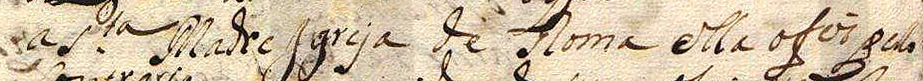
a s.ta Madre Jgreja de Roma ella o fes pelo
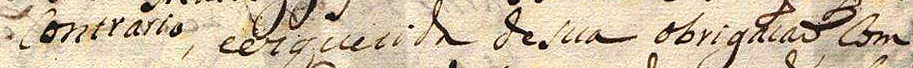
contrario, e esquecida de sua obrigaçaõ com
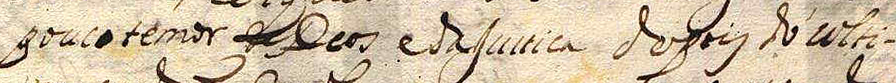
pouco temor de Deos e da Justiça depois do ulti
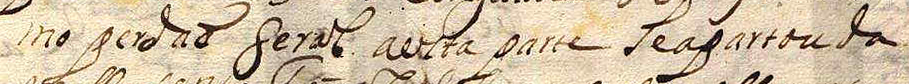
mo perdaõ geral a esta parte se apartou da
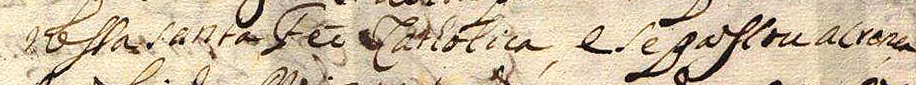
nossa santa Fée Catholica, e se passou a crença
